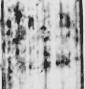○（正）
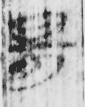昜（陽）
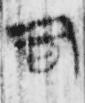司
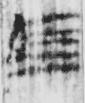馬
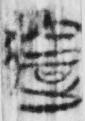達
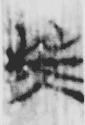芙
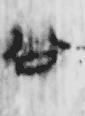公
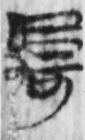騎
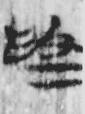爲
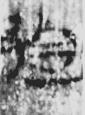○（正）
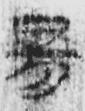昜（陽）
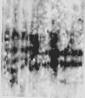貸
